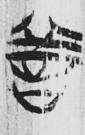善
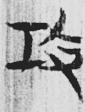攻
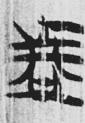者
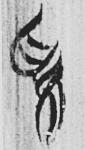奚
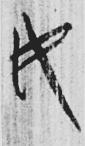女（如）
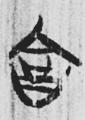合（答）
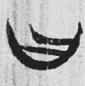曰
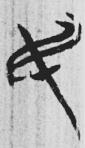民
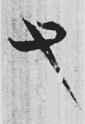又
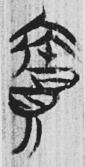{宀人缶貝}（保）
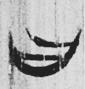曰
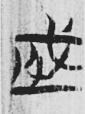城
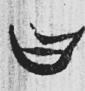曰
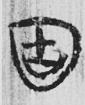固
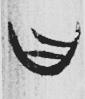曰
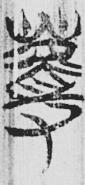{艸虍且又}（阻）
